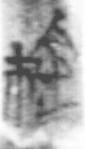○（錦）
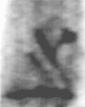之
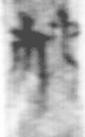○（純）
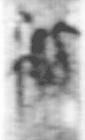紫
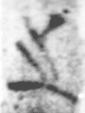之
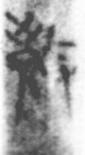○（綴）
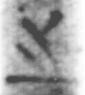之
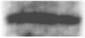一
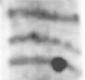三
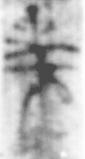朱
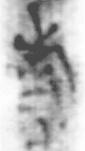○（旌）
